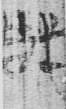○（風）
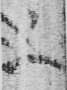之
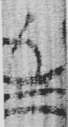至
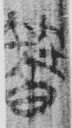○（孰）
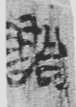飁
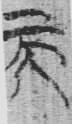而
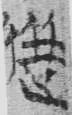迸
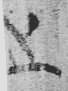之
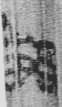○（聞）
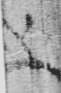之
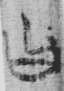曰
